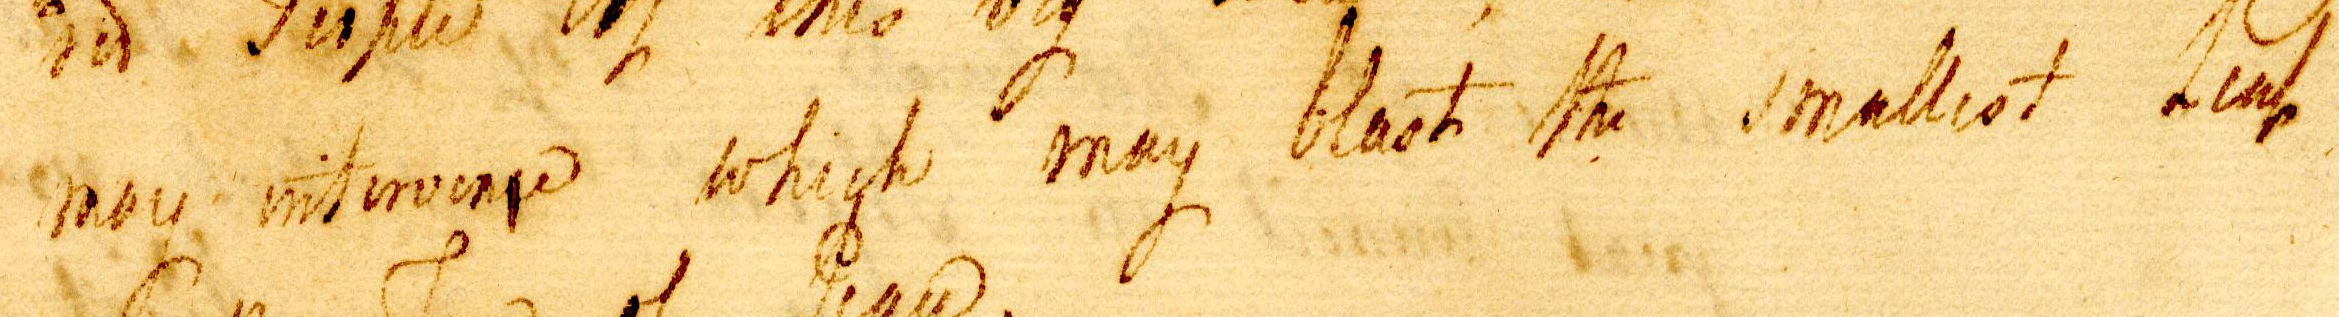may intervene which may blast the smallest Leaf
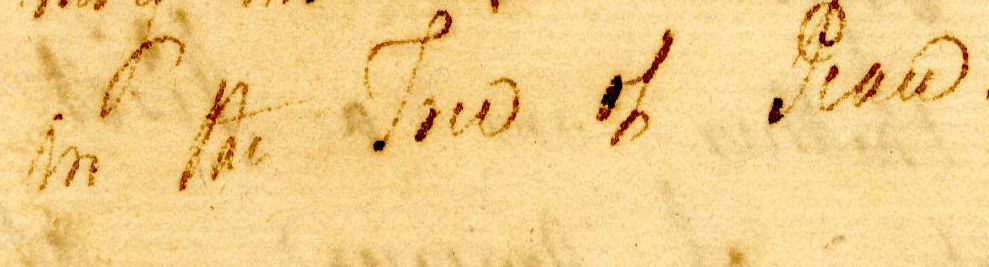in the Tree of Peace.
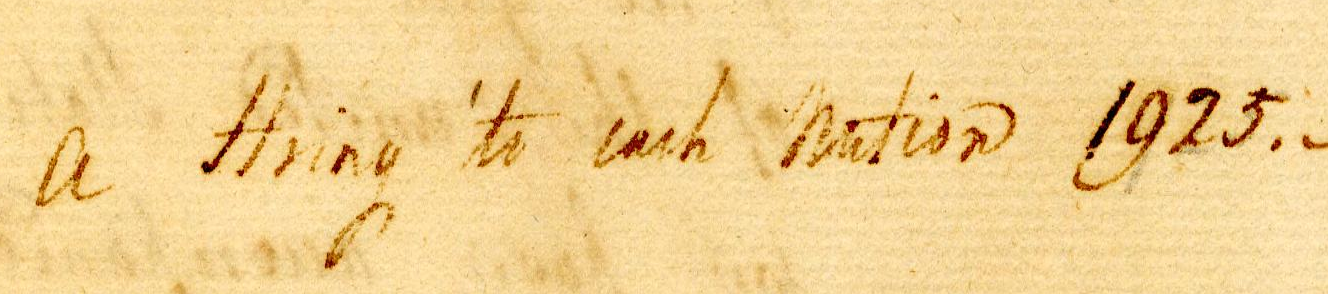A String to each Nation 1925.-
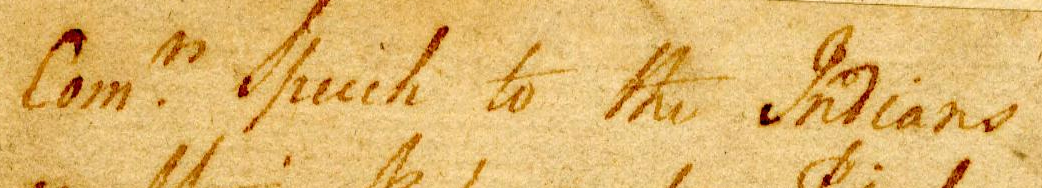Com^r. Speech to the Indians
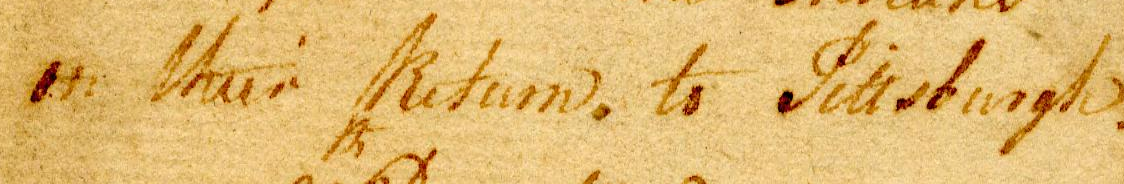on their Return to Pittsburgh.
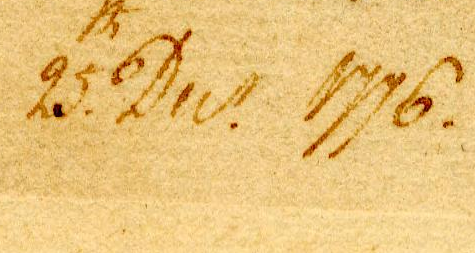25. Dec^r. 1776.
